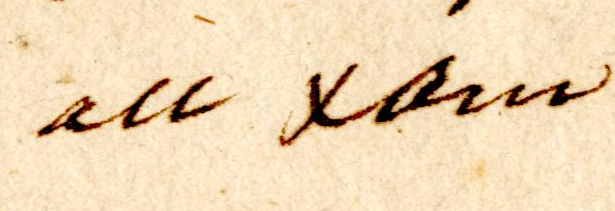all & am
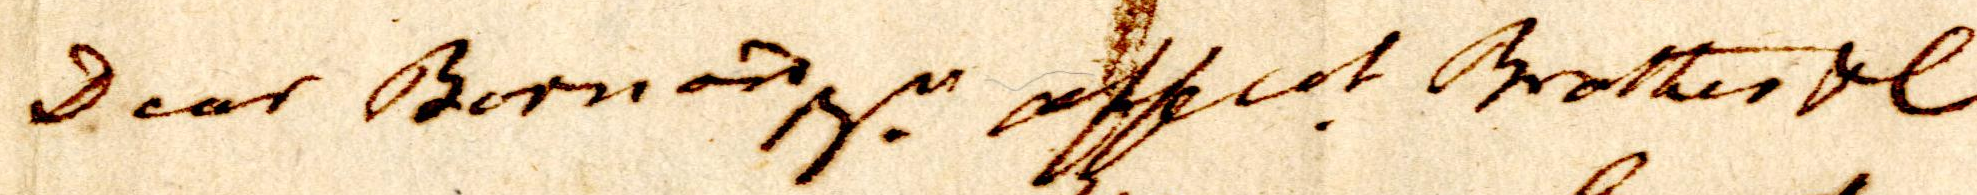Dear Barnard y^r. affect Brother &
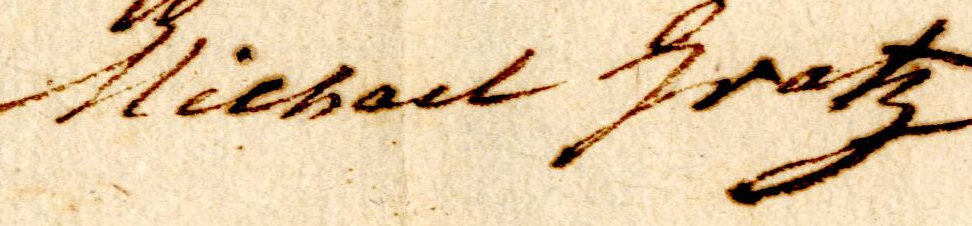Michael Gratz
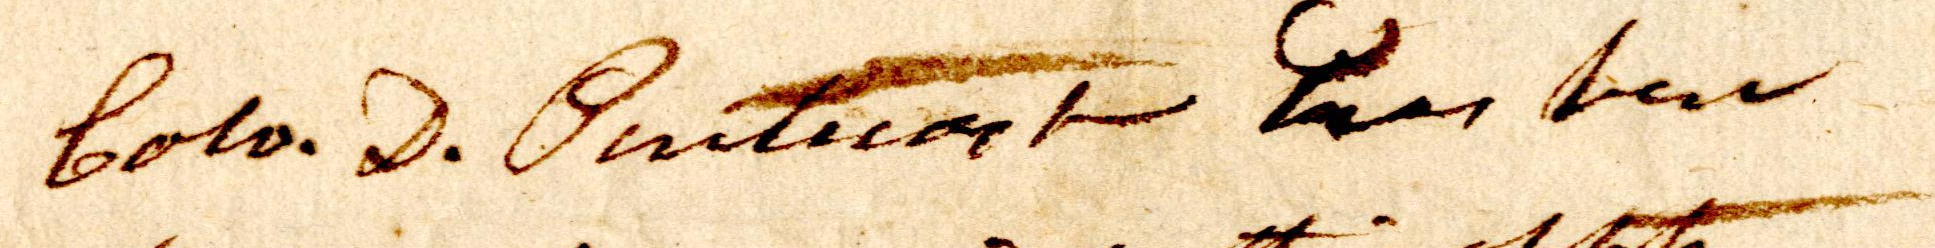Colo. D. Pentuat has been
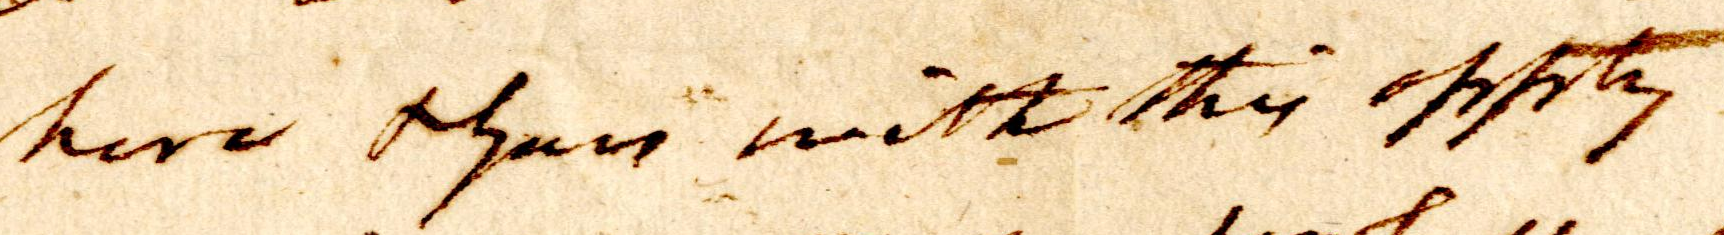here & gives with this opp^ty
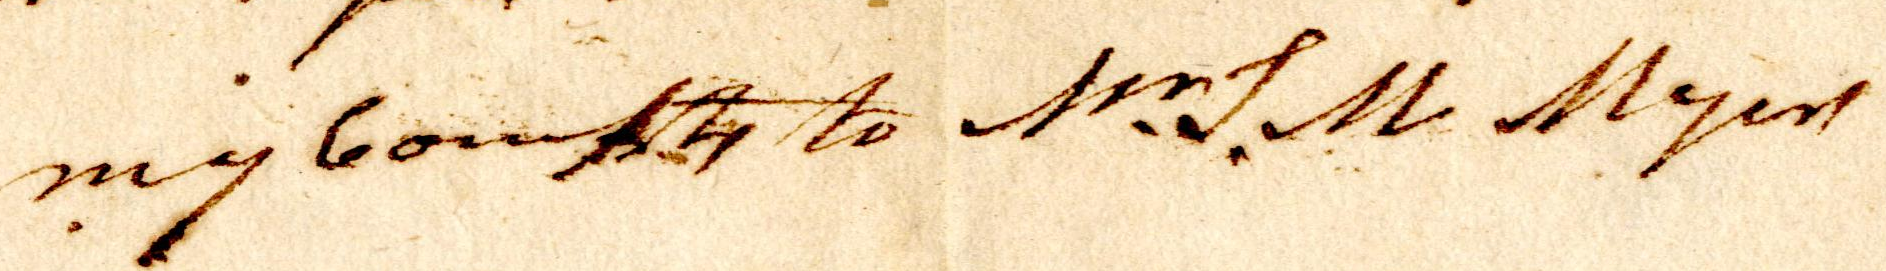my Comp^ty to M^r S.M Myers
